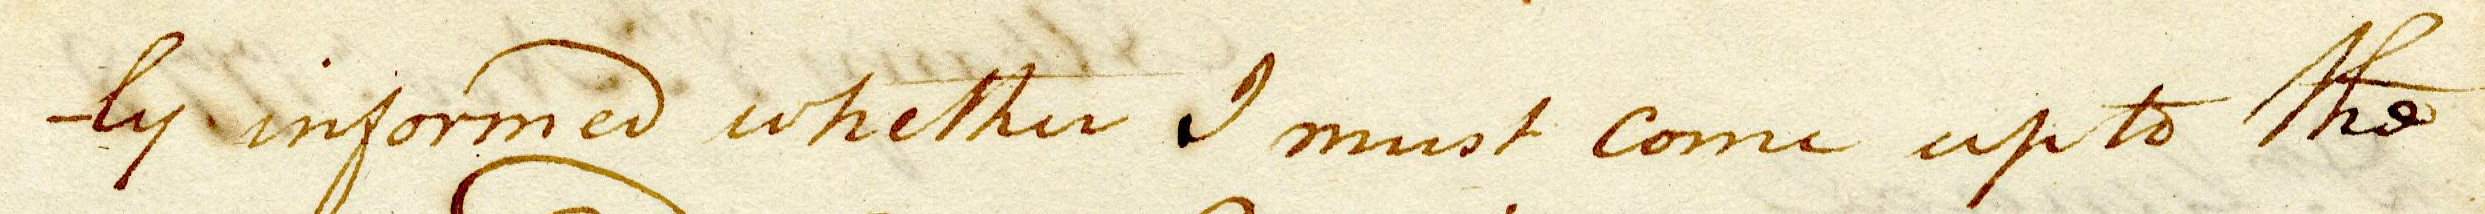-ly informed whether I must come up to the
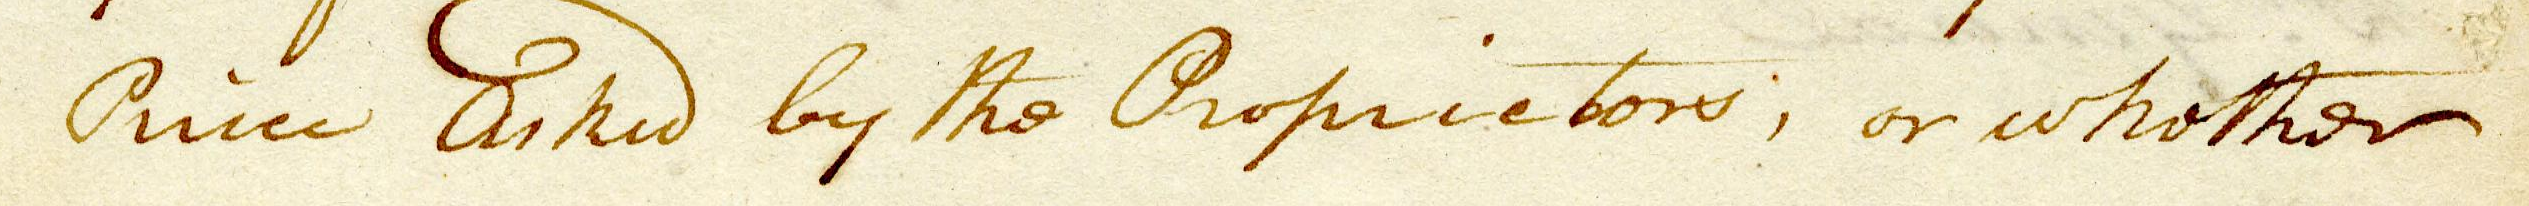Prince Asked by the Proprietors; or whether
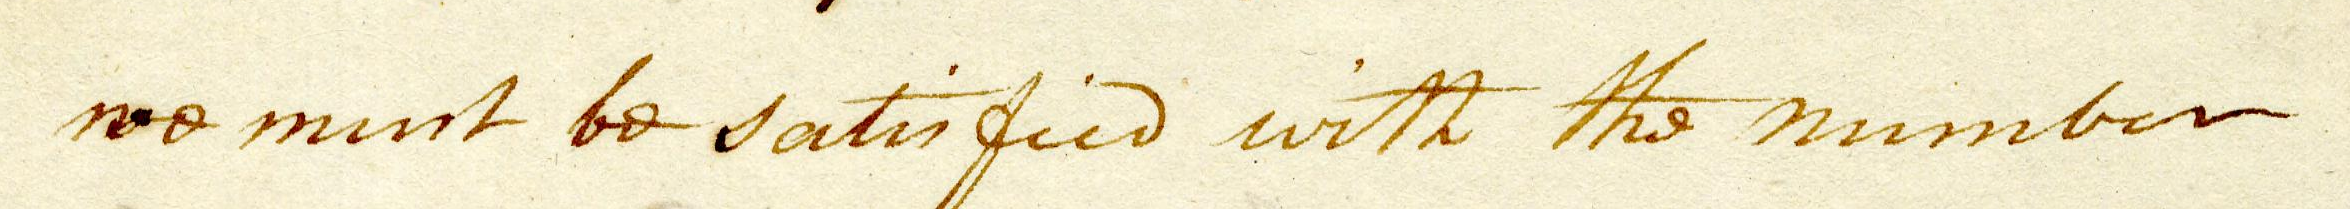no must be satisfied with the number
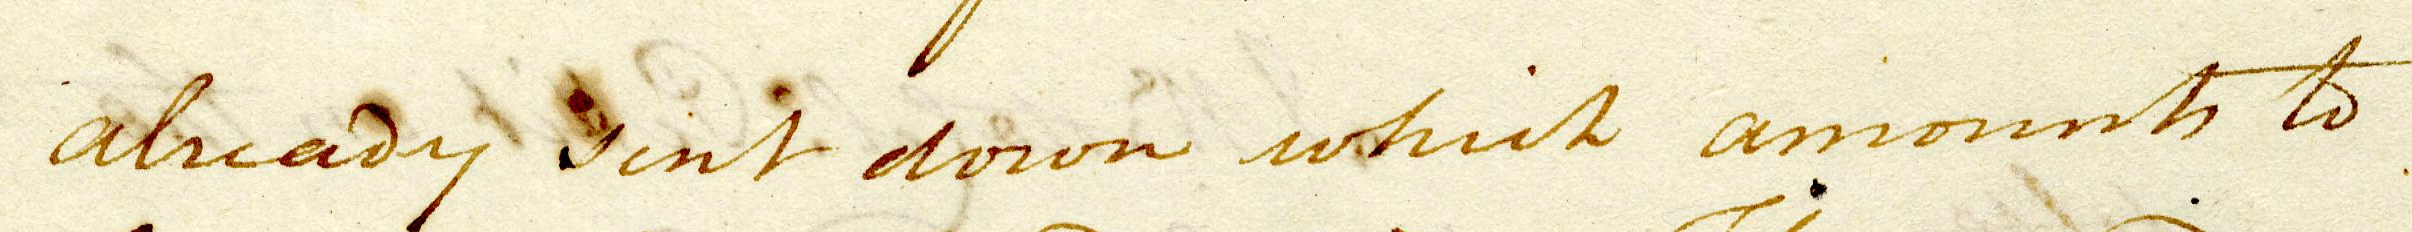already sent down which amounts to
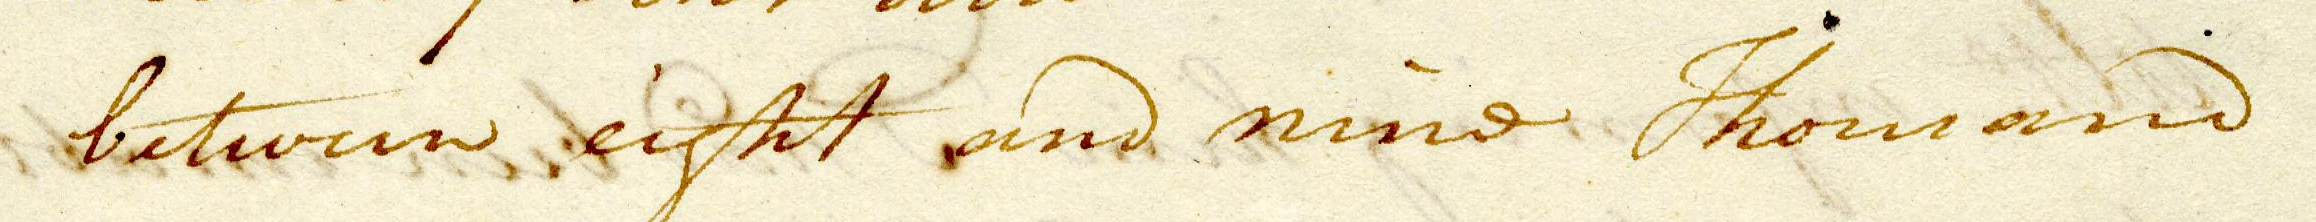between eight and nine Thousand
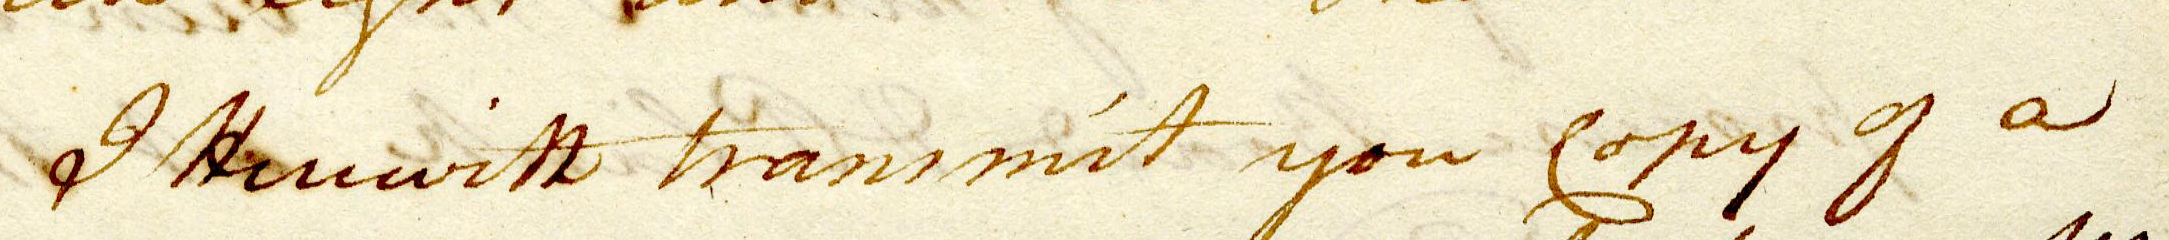I Herewith transmit you Copy of a
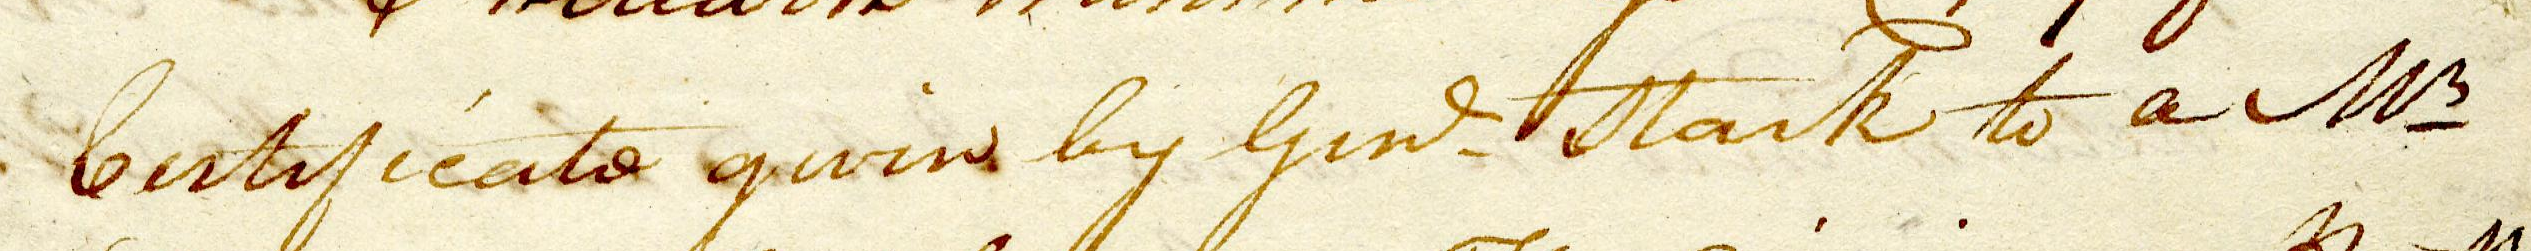Certificate given by Gen^l. Stark to a M^rs
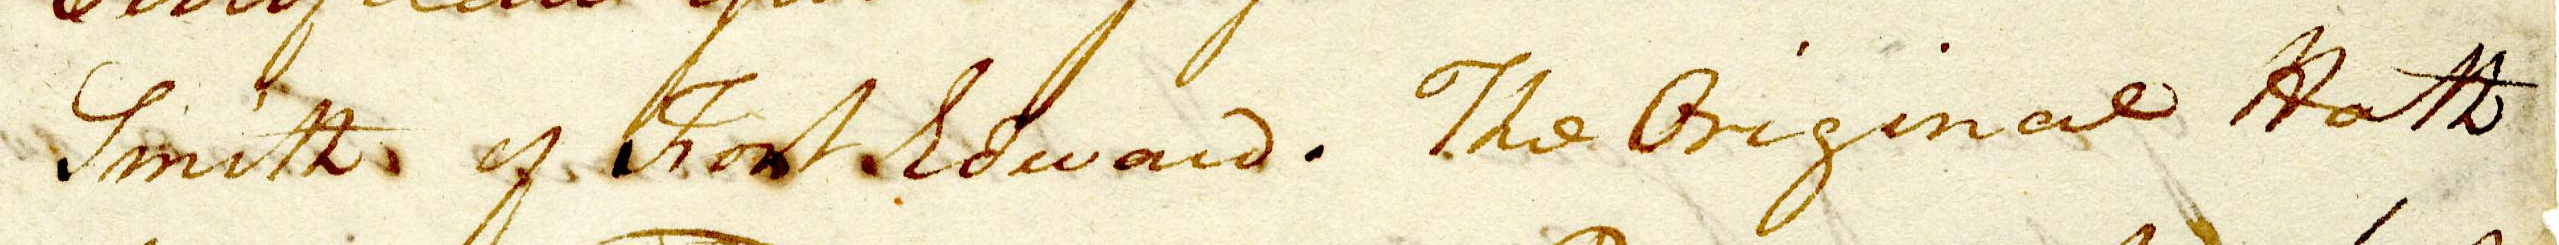Smith of Fort Edward. The Original Hath
